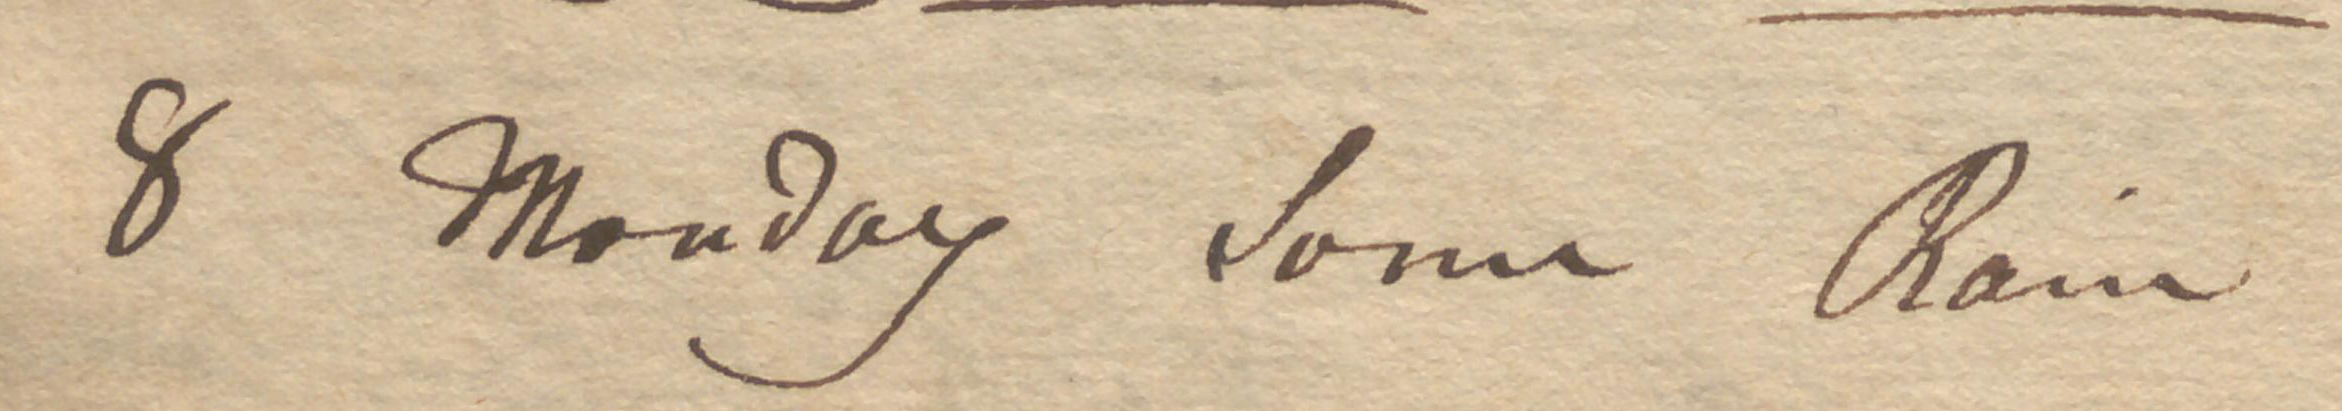8 Monday some Rain
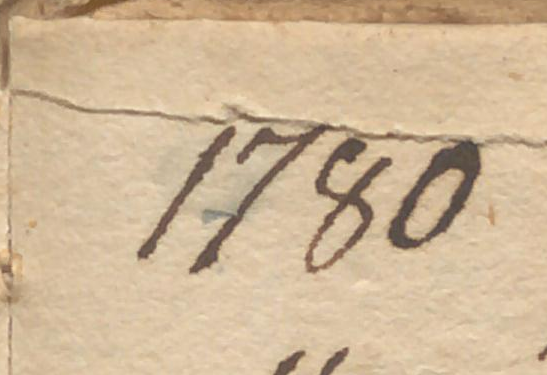1780
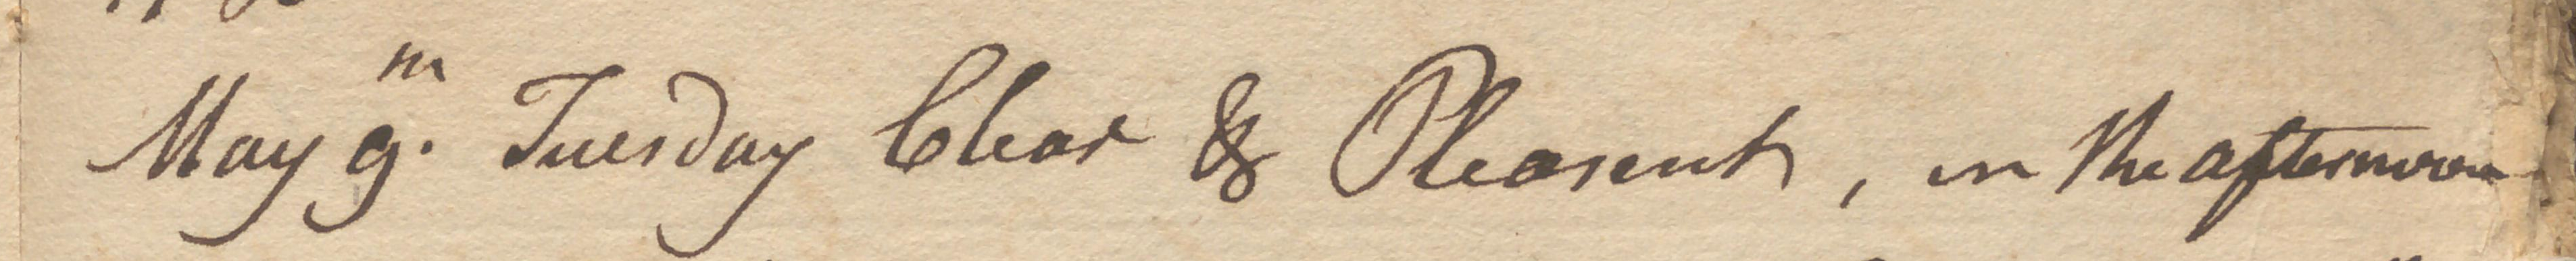May 9^th. Tuesday Clear & Pleasent, in the afternoon
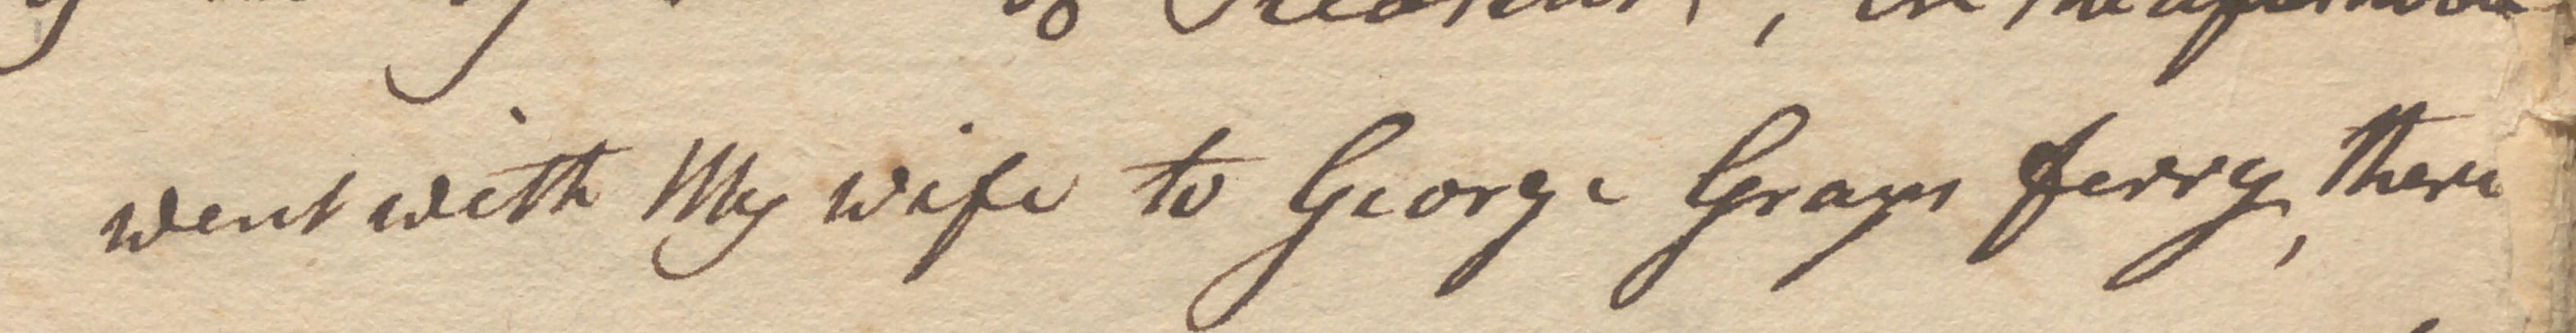went with My wife to George Grays ferry, there
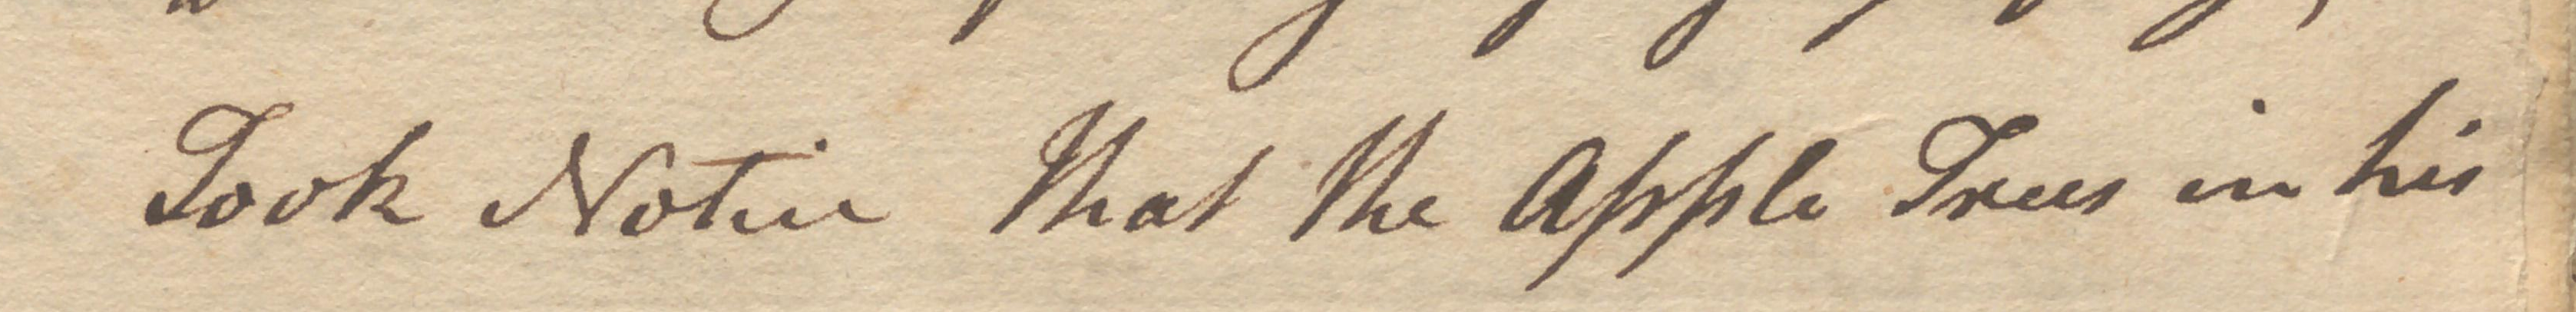Took Notice that the Apple Trees in his
